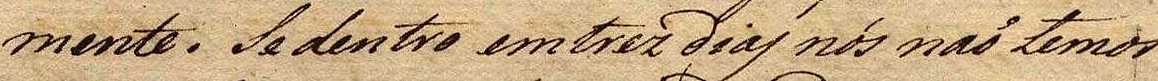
mente. Se dentro em trez dias nós naõ temos
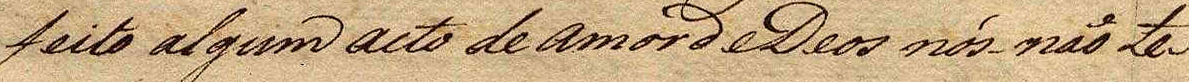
feito algum acto de amor de Deos nós-não te
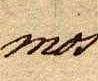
mos
